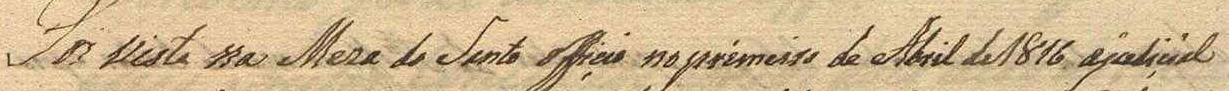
Foi vista na Meza do Santo officio no primeiro de Abril de 1816 a judicial
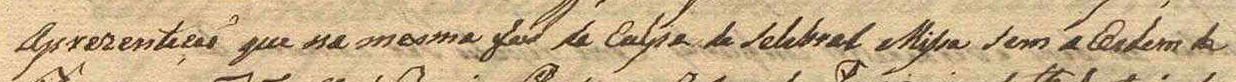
Aprezenteçaõ que na mesma fez da Culpa de selebral Missa sem a Ordem de
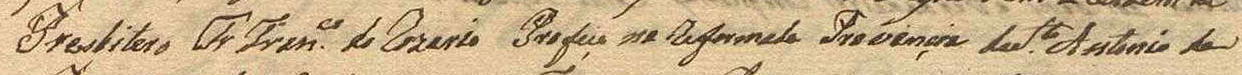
Presbitero Fr Fran.co do Rozario Profeço na Reformada Provincia da S.to Antonio de
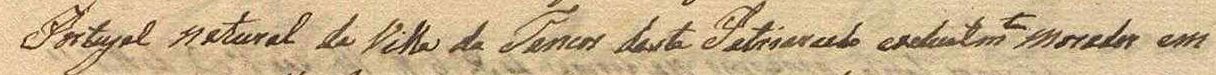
Portugal natural da Villa do Tencos deste Patriarcado e acluatm.te morador em
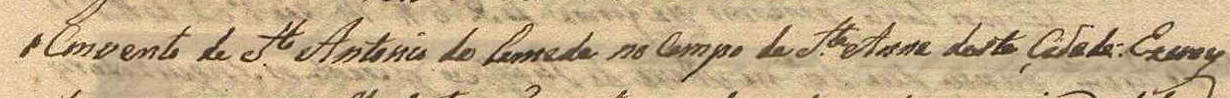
o Convento de S.to Antonio de Lameda no Campo de S.ta Anna desta Cidade: Exames
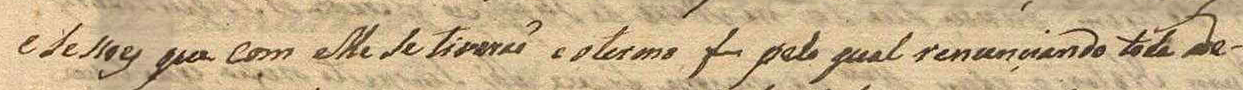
e sessoes que com elle se tiveraõ e o termo f pelo qual renunciando toda de
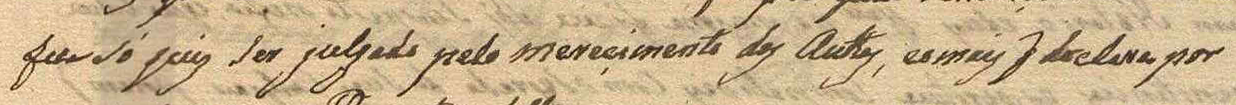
fesa so quis ser julgado pelo merecimento dos Autos, e o mais q̄ declara por
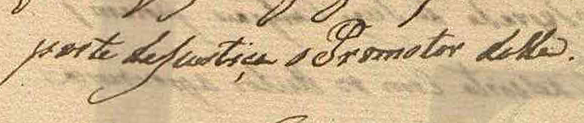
parte da Justiça o Promotor della.
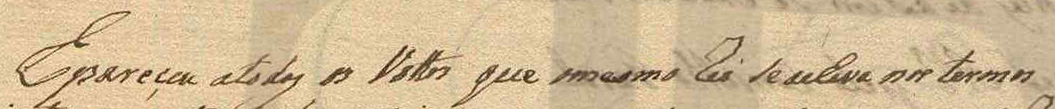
E pareceu a todos os Vottos que o mesmo Reo se achava nos termos
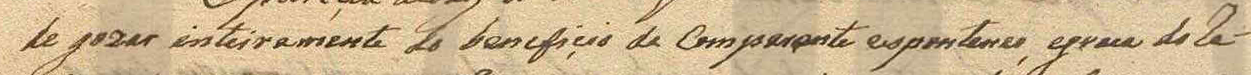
de gozar inteiramente do beneficio da Comparente esponteneo e grau do Re
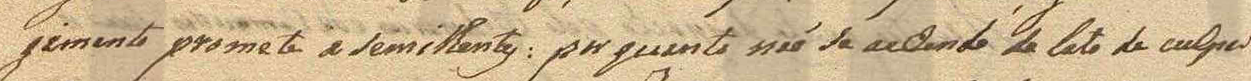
gimento promete a semilhentes: porquanto naõ se achando delato de culpa
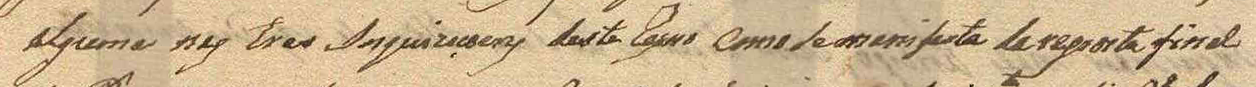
alguma nas tres Inquiziçoens deste Reyno como se manifesta da reposta final
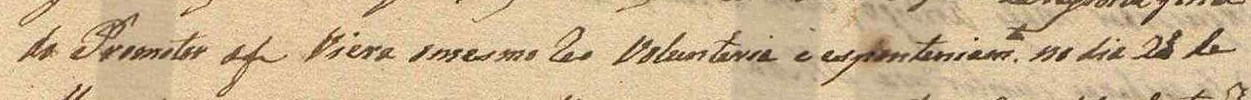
do Promotor a f Viera o mesmo Reo Voluntaria e espontaniam.te no dia 25 de
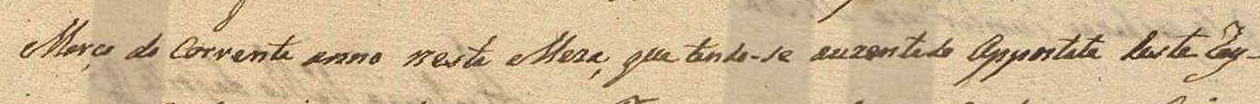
Março do corrente anno nesta Meza, que tendo-se auzentado Appostata deste Rey
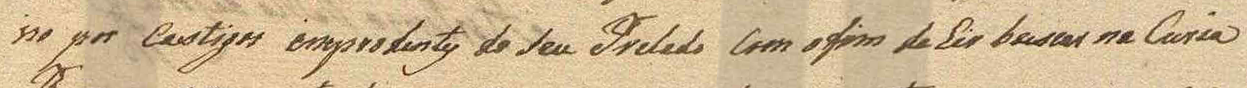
no por castigos improdentes do seu Prelado com o fim de hir buscar na Curia
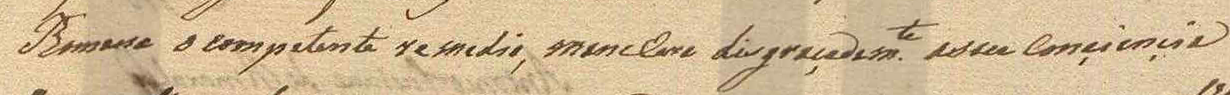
Romana o competente remedio, manchara disgraçadem.te a sua conciencia
